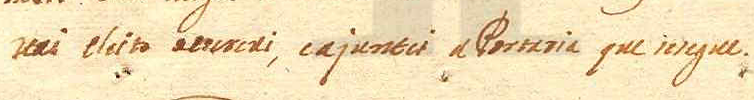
uaõ eleito o escrevi, e ajuntei a Portaria que se segue.
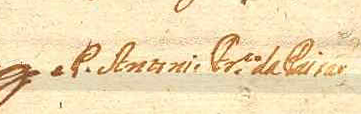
o P. Antonio Fr.co da Paixão
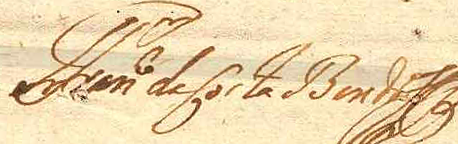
Fran.co da Costa Bandra
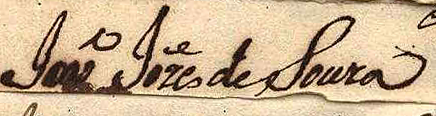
Ioaõ Iozê de Souza
